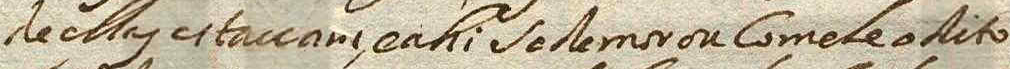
de ellas estauam, e ahi se demorou ou Com ele o dito
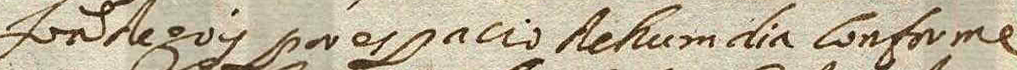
Joã de gois por espacio de hum dia Conforme
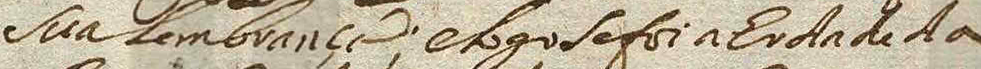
sua lembrança; e logo se foi a Erdade da
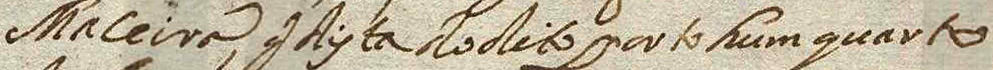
Maceira, q̄ dista do dito porto hum quarto
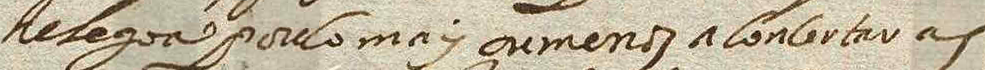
de legoa pouCo mais ou menos a Concertar as
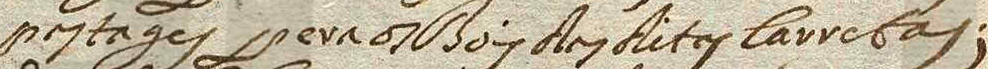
pastages pera os Bois das dita Carretas;
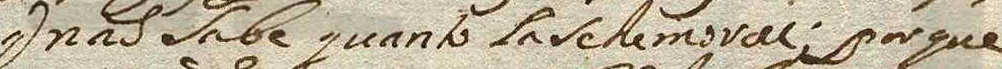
q̄ naõ sabe quanto la se demorou; porque
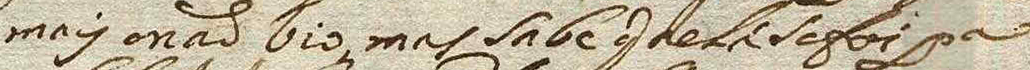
mais o naõ vio, mas sabe q̄ de lá se foi pa
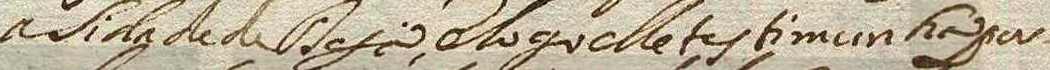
a Sidade de Beja, & logo elle testimunha por
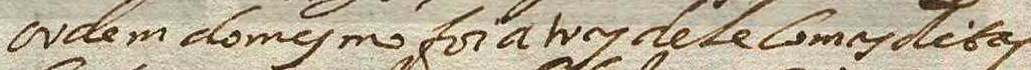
ordem do mesmo foi atras dele Com as ditas
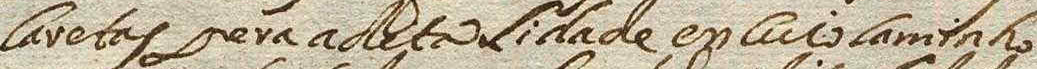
Caretas pera a dita Cidade, en cuio caminho
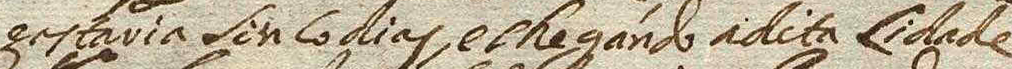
gastaria sinco dias, e chegando a dita Cidade
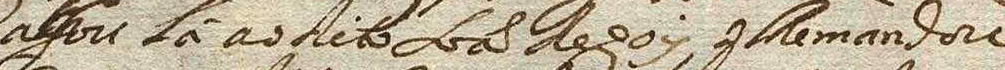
achou lá ao dito Joã de gois, q̄ lhe mandou
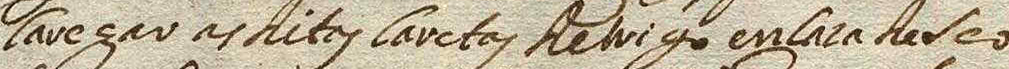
Caregar as ditas Caretas de trigo en Caza de seo
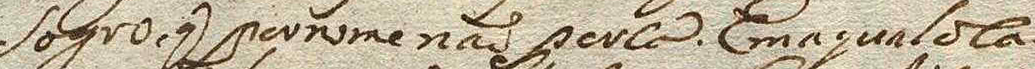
Sogro, q̄ por nome naõ perca. Em a qual oCa
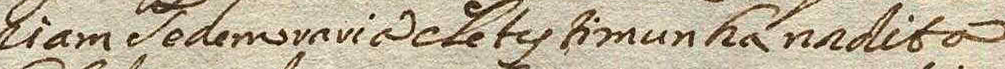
ziam se demoraria ele testimunha na dita
